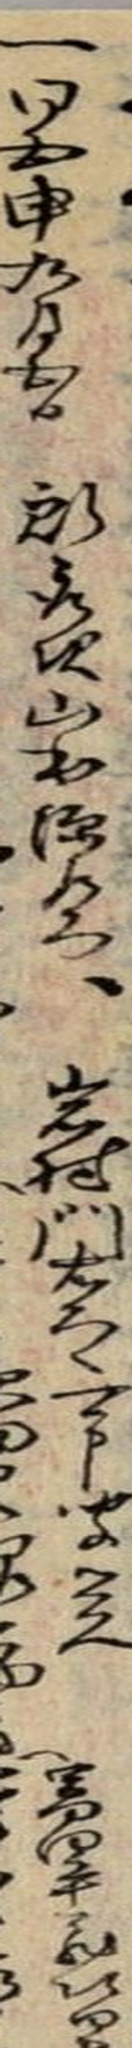一同五申九月五日願取次山本源右衛門岩村門右衛門へ可申聞覚
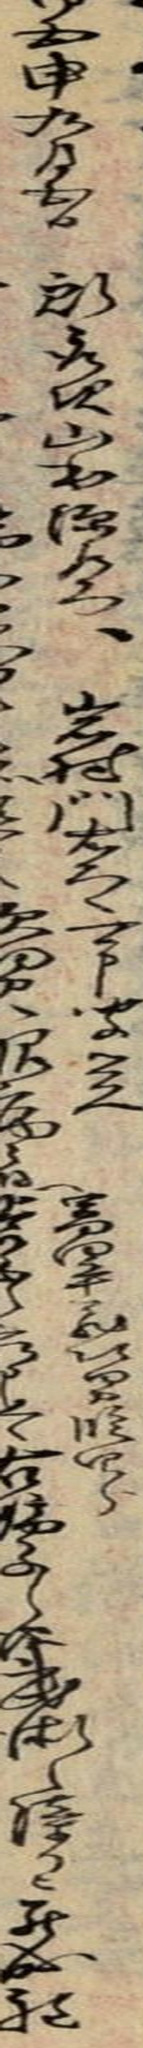一同五申九月五日願取次山本源右衛門岩村門右衛門へ可申聞覚
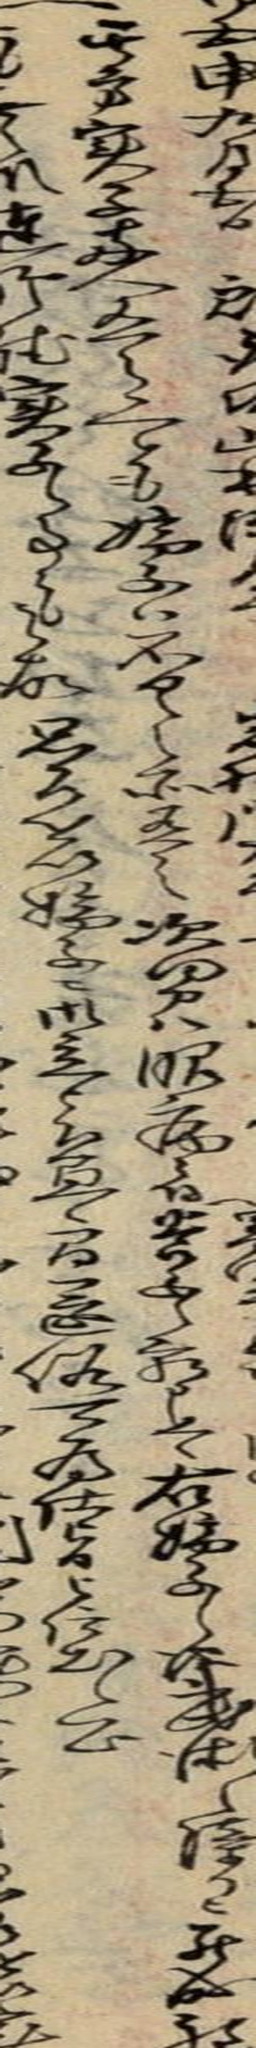にも無之段達御聴実子之事にも候故思召を以嫡子に御立被下置候間還俗可為仕旨被仰出候以上
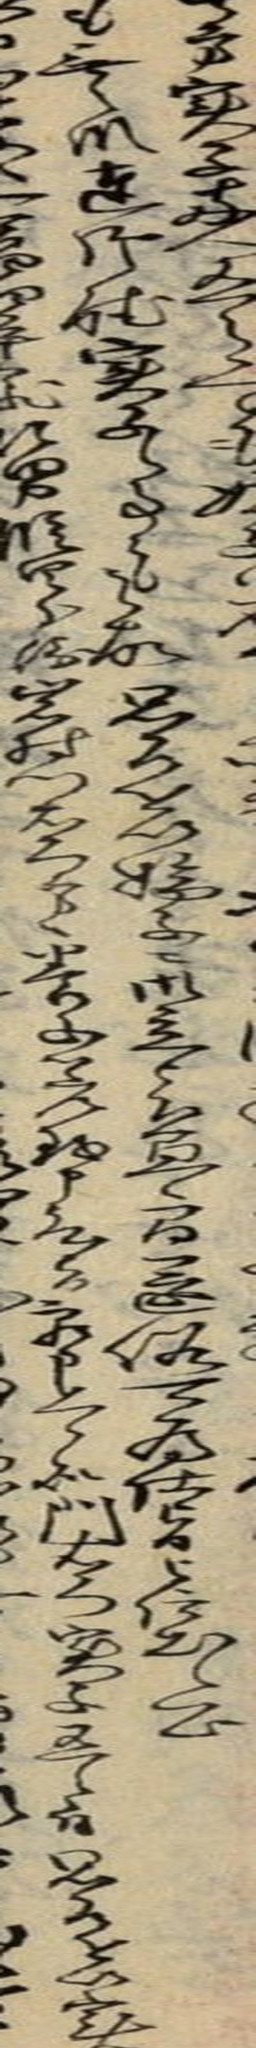杉田五大夫へ」富田平蔵次男段四郎儀岩村門右衛門方へ養子差越申度旨願申上候処門右衛門実子有之に付思召を以実
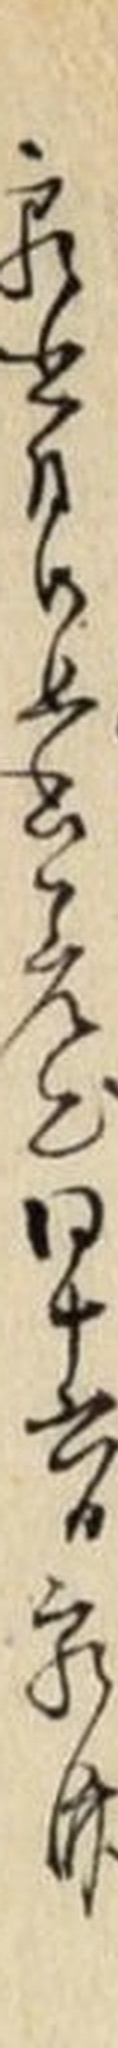願書付口上書差出同十六日願済
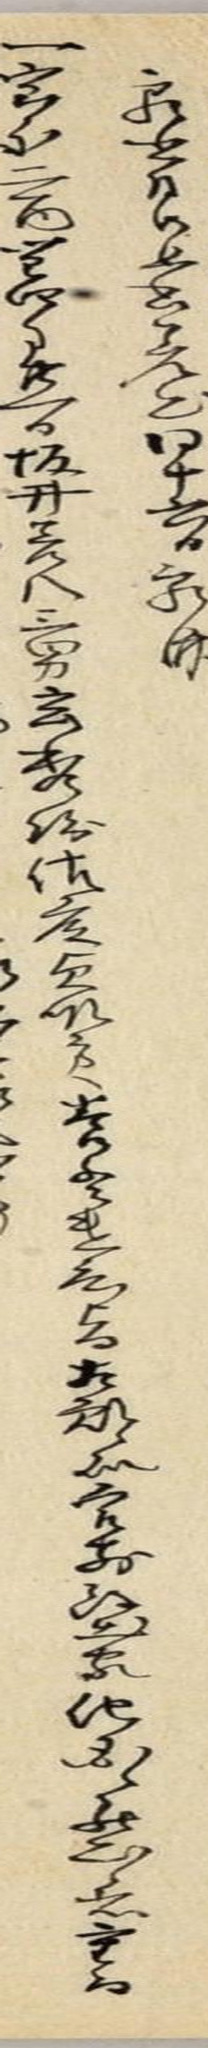一宝永二酉閏四月廿一日坂井彦八三男玄秀儀佐藤貞順方へ養子に遣度旨相願候処最前致出家他国へ罷出候者重而
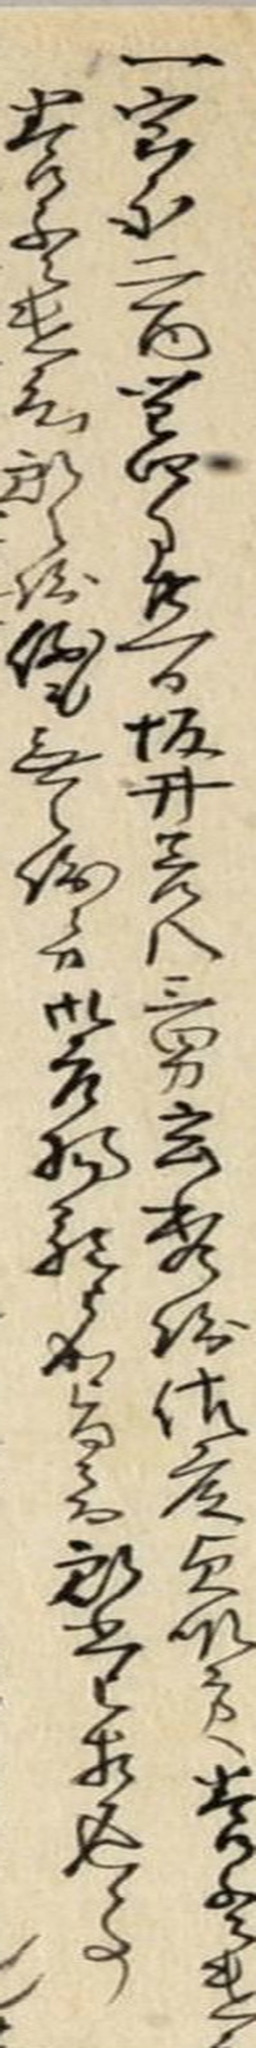養子に遣度願之儀例も無之儀に付御取揚難被成旨に而願書被相返候事
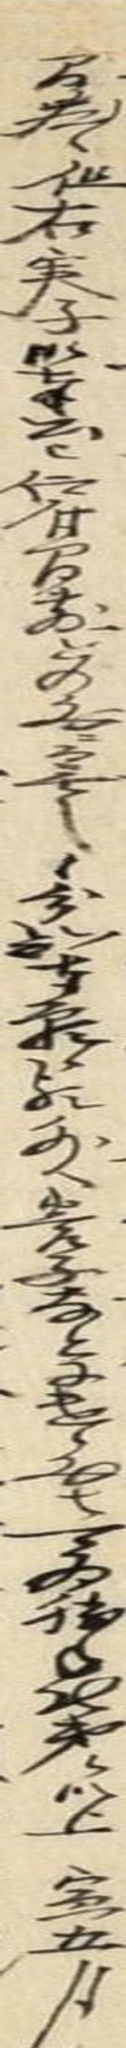間敷候但右実子御奉公被仰付間敷との義に而無之候分知奉願候歟外へ養子なとに遣候義は可為勝手次第候以上寅五月
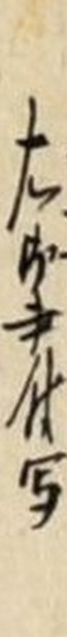右御書付写
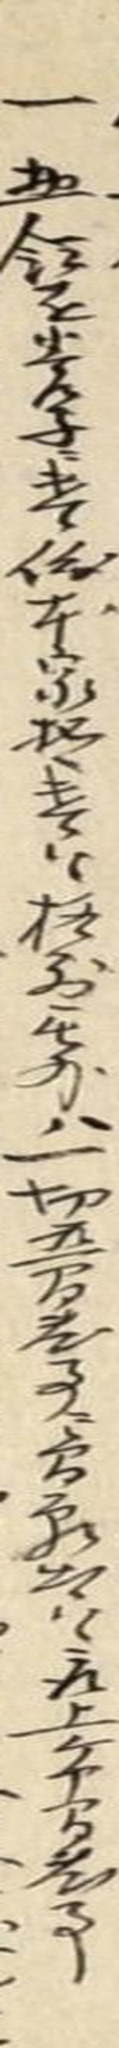一惣領を養子に遣候儀本家抔へ遣候はゝ格別其外は一切有間敷事に候間願出候はゝ取上け間敷事
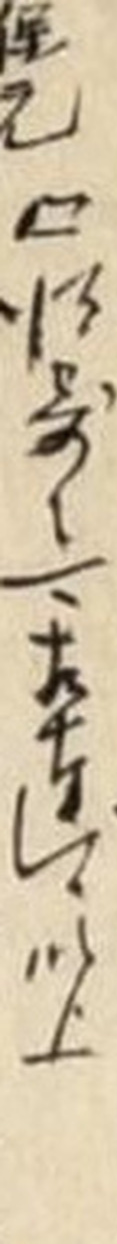心得寄々可相達候以上
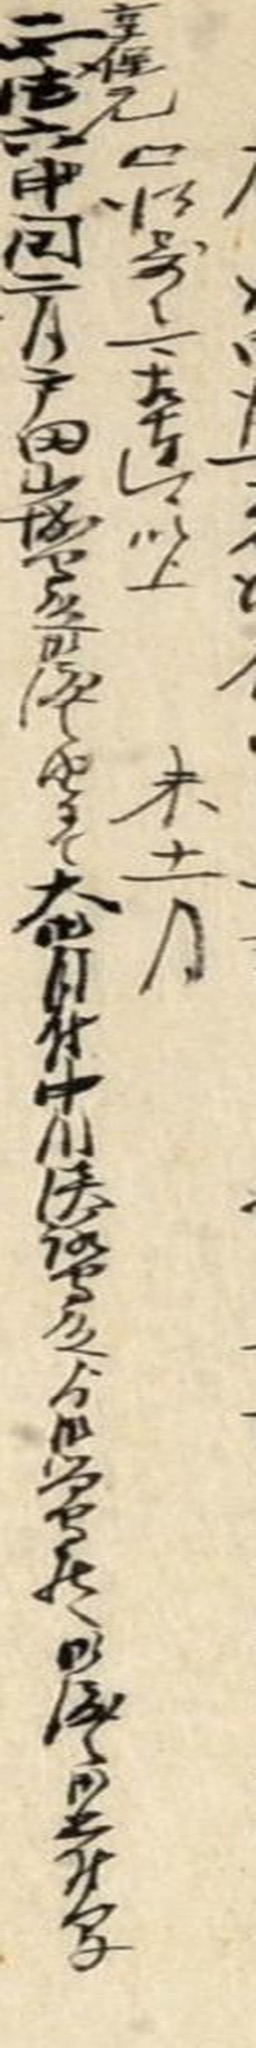一正徳六申閏二月戸田山城守殿可申渡之由にて大御目付中川淡路守殿ゟ御留守居へ御渡候御書付写
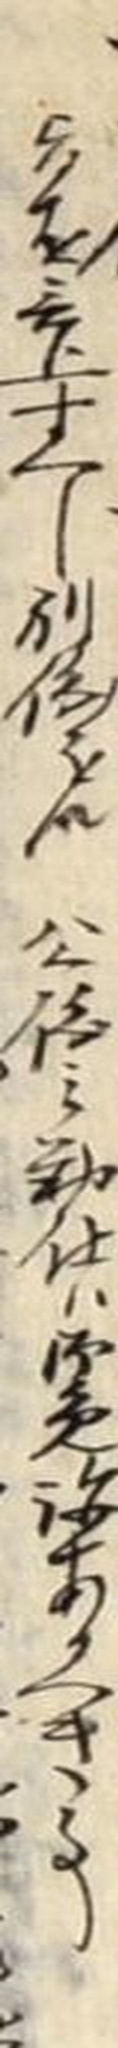旨を言上すへし別儀を以公儀之勤仕ハ御免許あるへき事
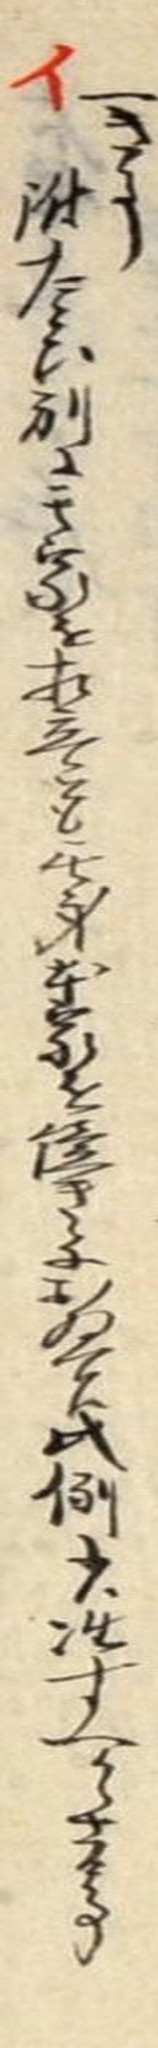附たとひ別に其家を相立候とも其身本家を続き候におゐてハ此例にハ准すへからさる事

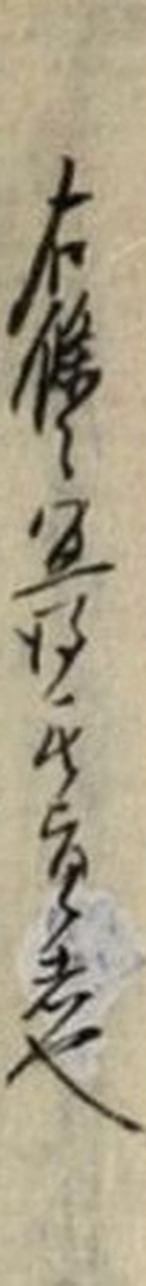右条々宜得其旨候者也
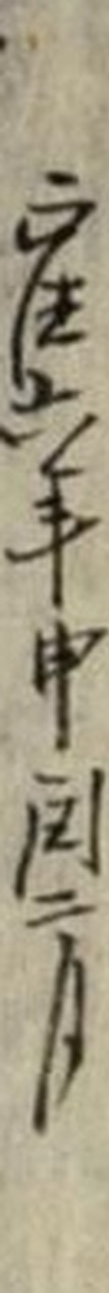正徳六年申閏二月
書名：養子縁組之部
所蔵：福井県文書館 Fukui Prefectural Archives
